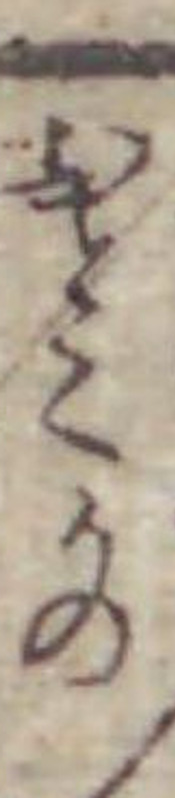おとこかの
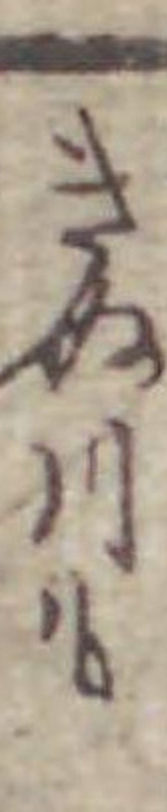きぬ川も
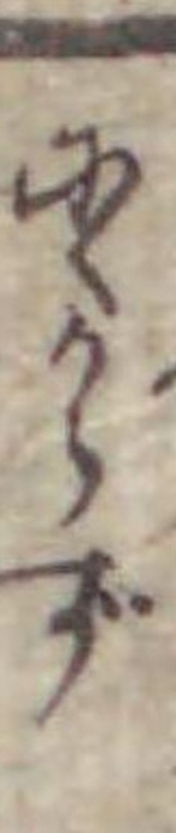にくからず
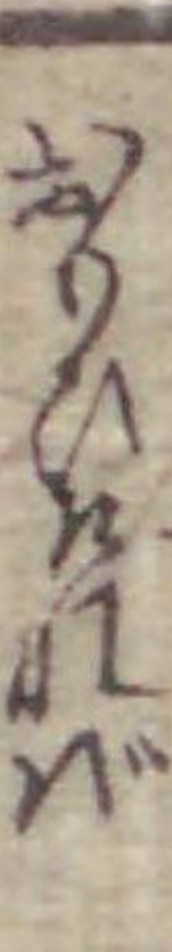おもひければ
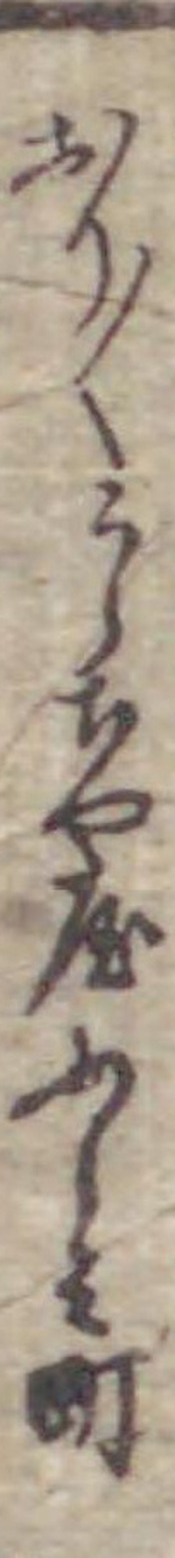おり〳〵うらちや屋ふしみ町
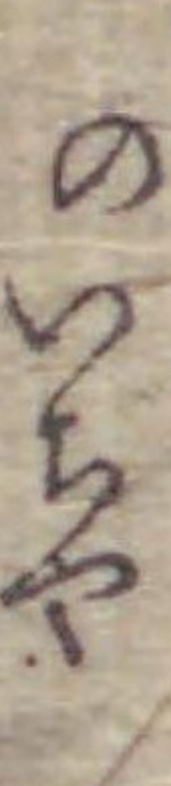のいちや
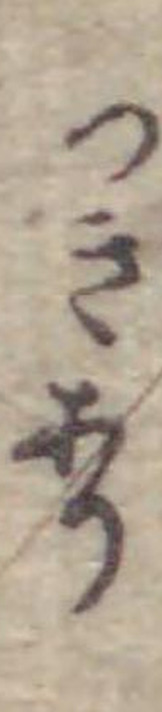つきあり

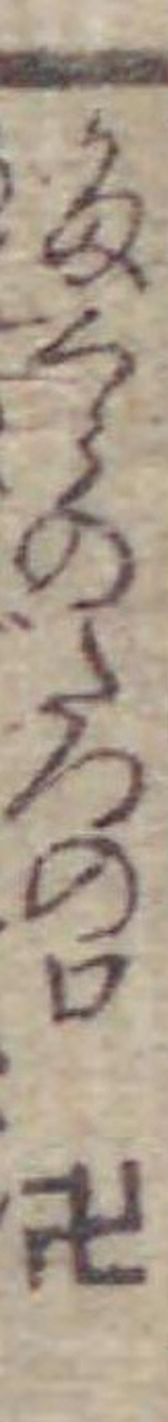かまくらのたつの口
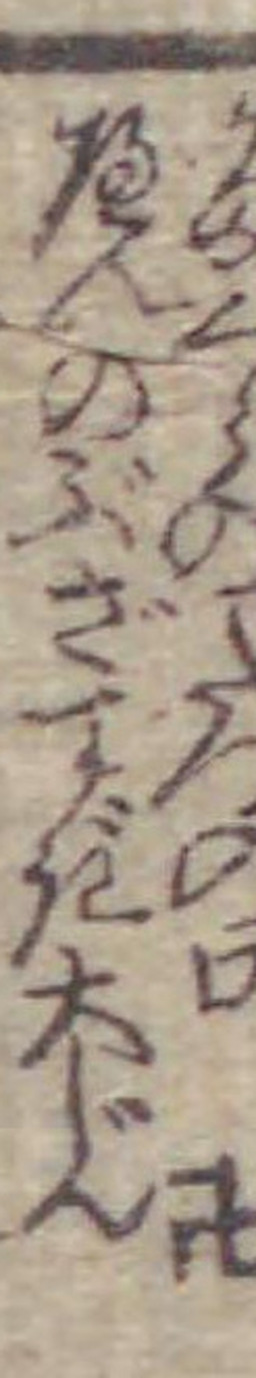へんのぶざすぎ大じん
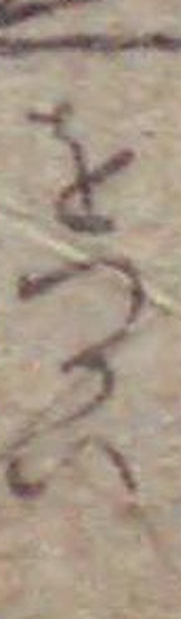をつかい
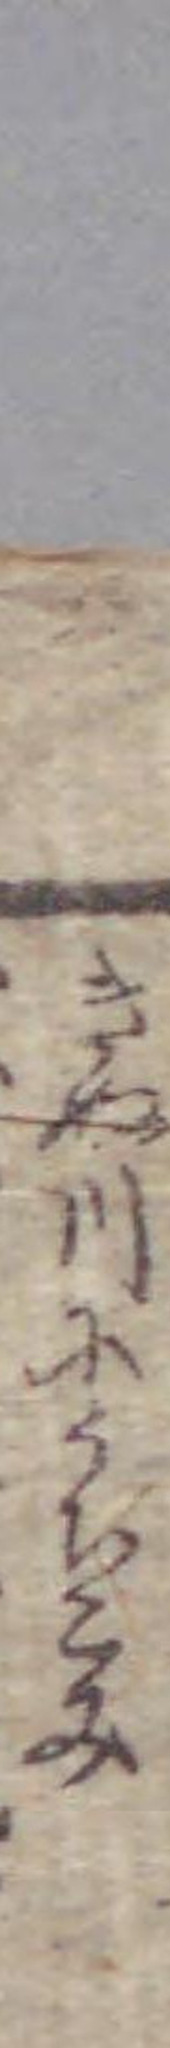きぬ川にうちこみ
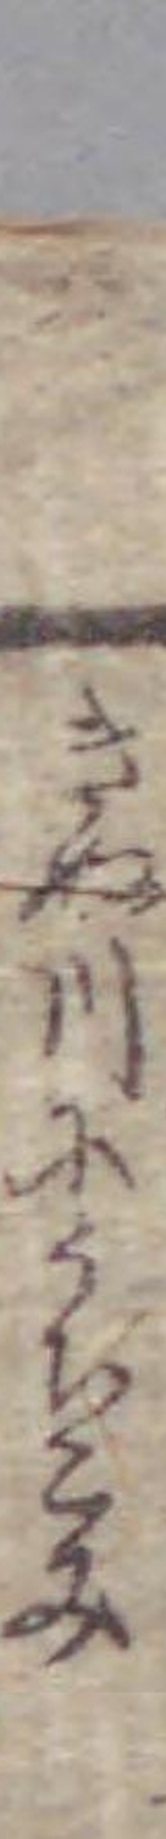きぬ川にうちこみ
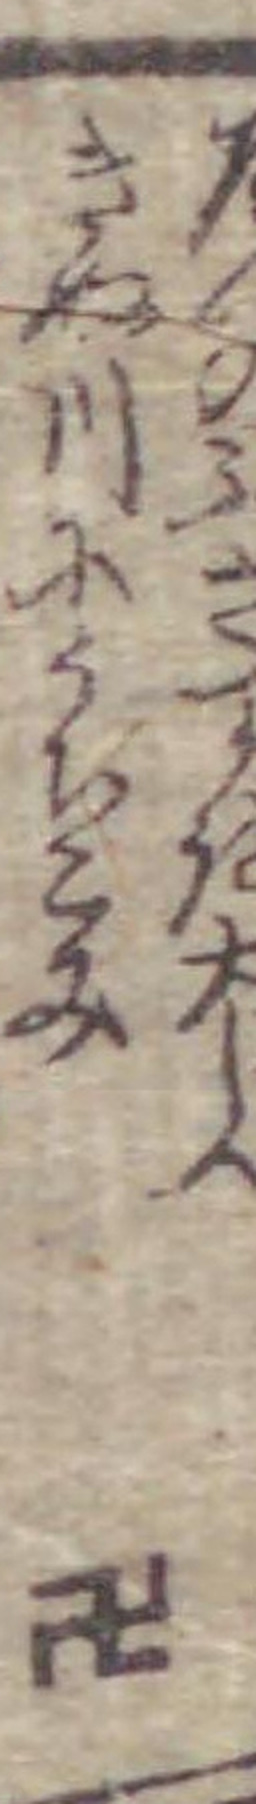きぬ川にうちこみ
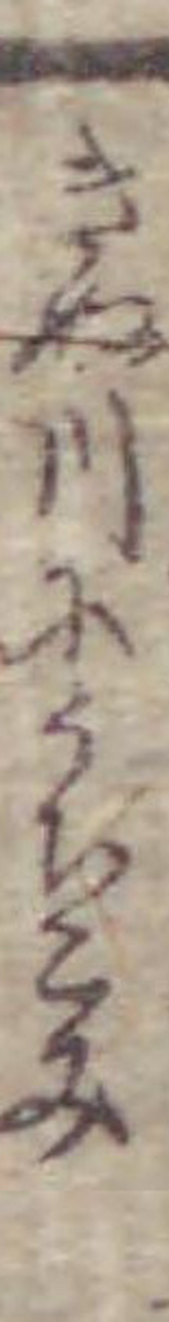きぬ川にうちこみ
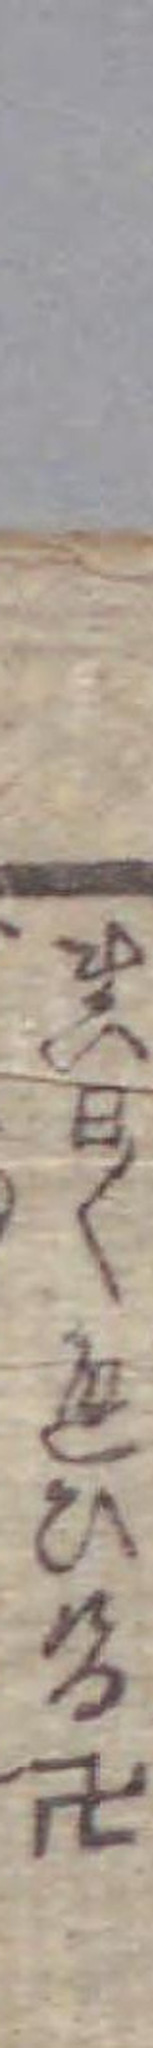まい日〳〵通ひける
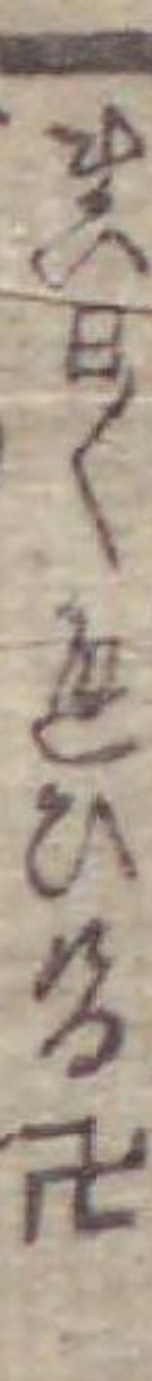まい日〳〵通ひける
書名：嗚呼不侭世之助噺 : 3巻
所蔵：国立国会図書館 National Diet Library, JAPAN
